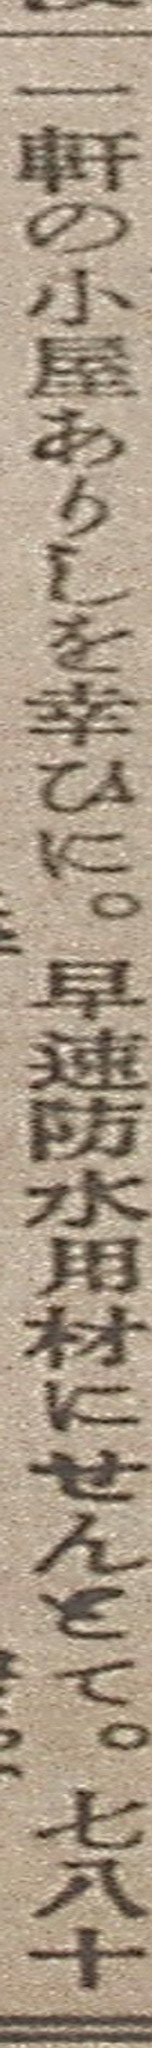一軒の小屋ありしを幸ひに。早速防水用材にせんとて。七八十
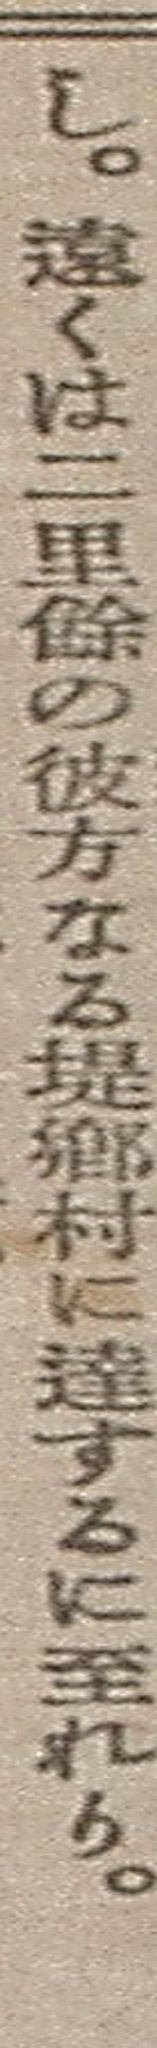し。遠くは二里余の彼方なる堤郷村に達するに至れり。
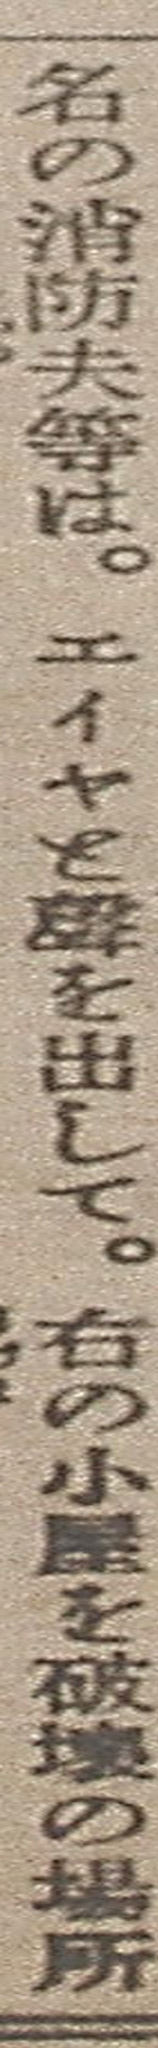名の消防夫等は。エイヤと声を出して。右の小屋を破壊の場所
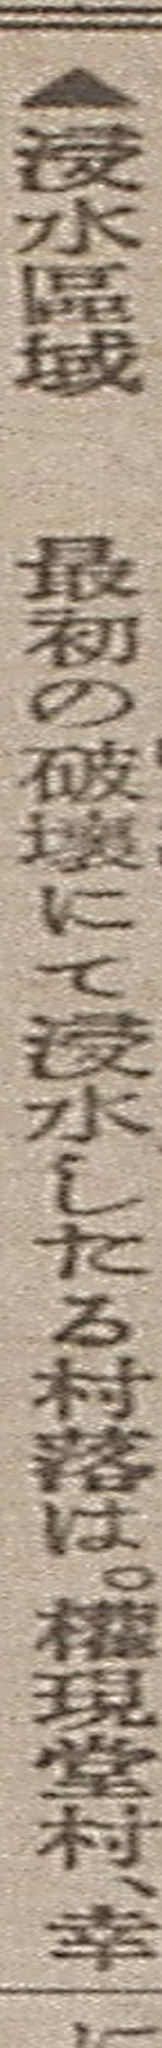▲浸水区域最初の破壊にて浸水したる村落は。権現堂村、幸
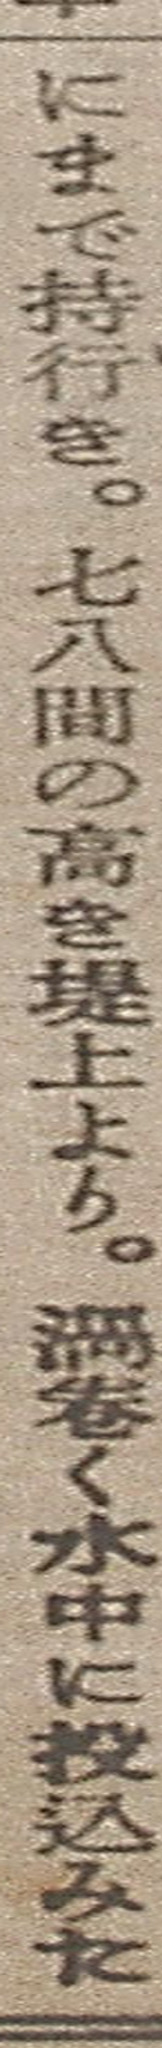にまで持行き。七八間の高き堤上より。渦巻く水中に投込みた
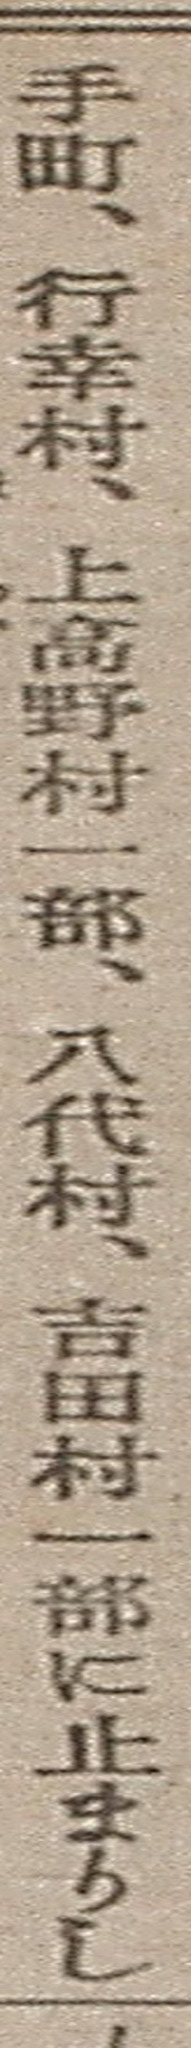手町、行幸村、上高野村一部、八代村、吉田村一部に止まりし
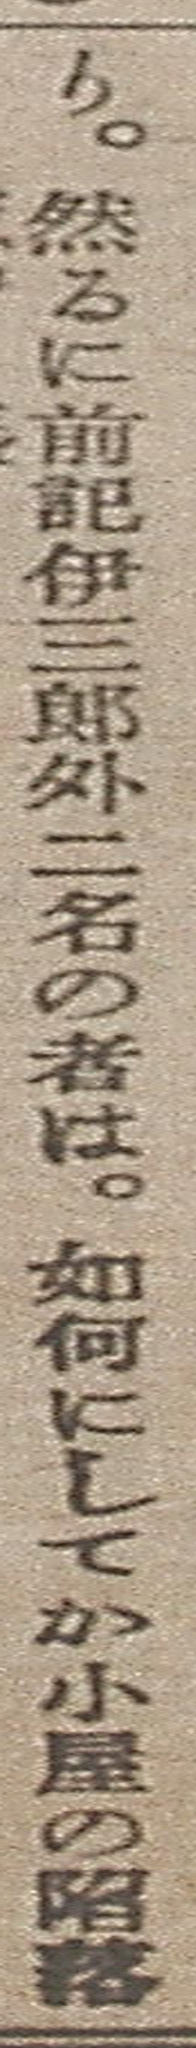り。然るに前記伊三郎外ニ名の者は。如何にしてか小屋の陥落
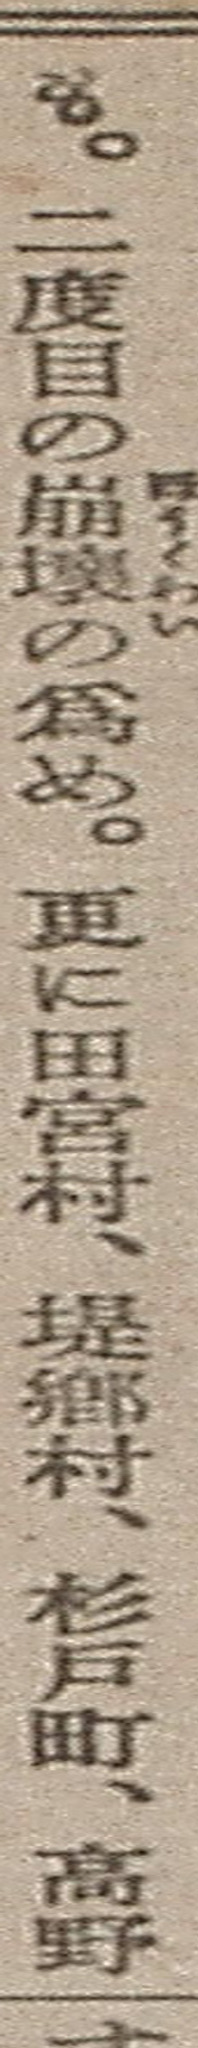も。二度目の崩壊の為め。更に田宮村、堤郷村、杉戸町、高野
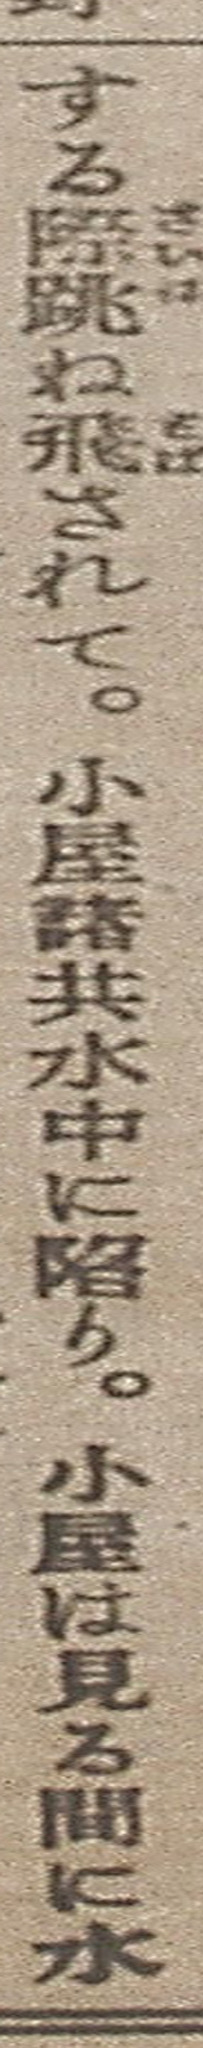する際跳ね飛されて。小屋諸共水中に陥り。小屋は見る間に水
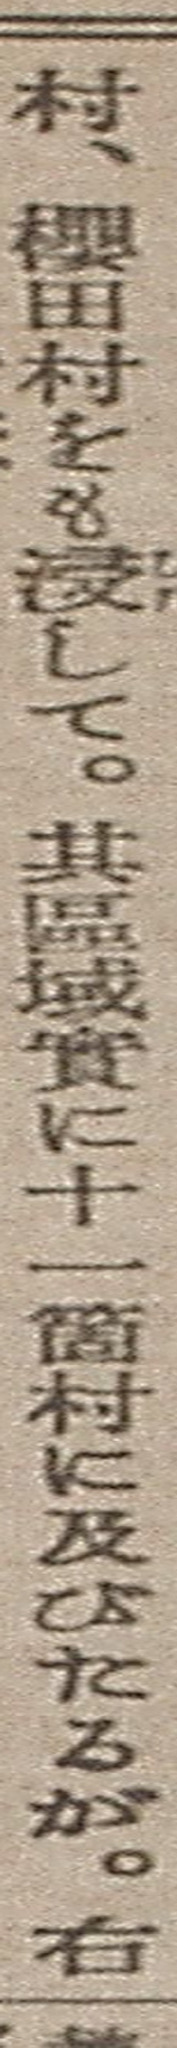村、桜田村をも浸して。其区域実に十一箇村に及びたるが。右
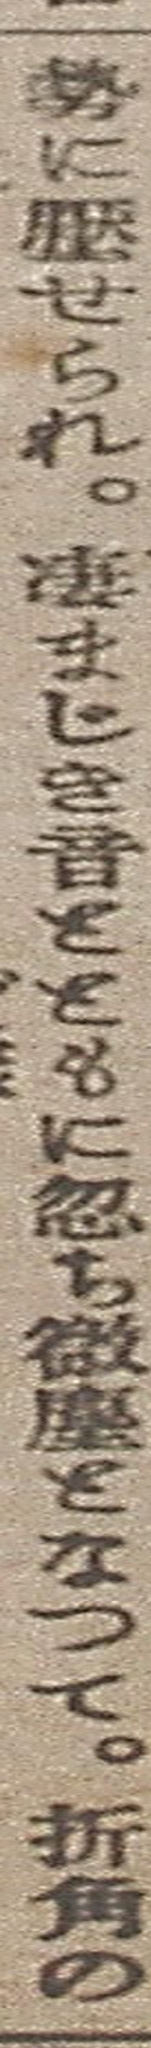勢に圧せられ。凄まじき音とともに忽ち微塵となつて。折角の
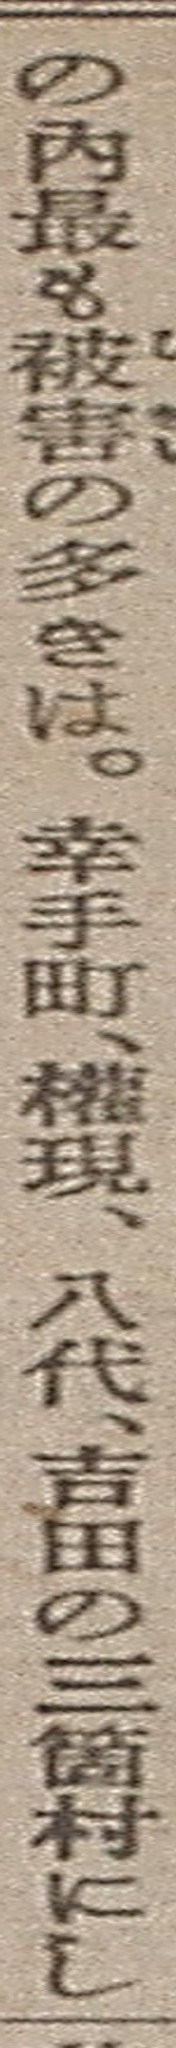の内最も被害の多きは。幸手町、権現、八代、吉田の三箇村にし
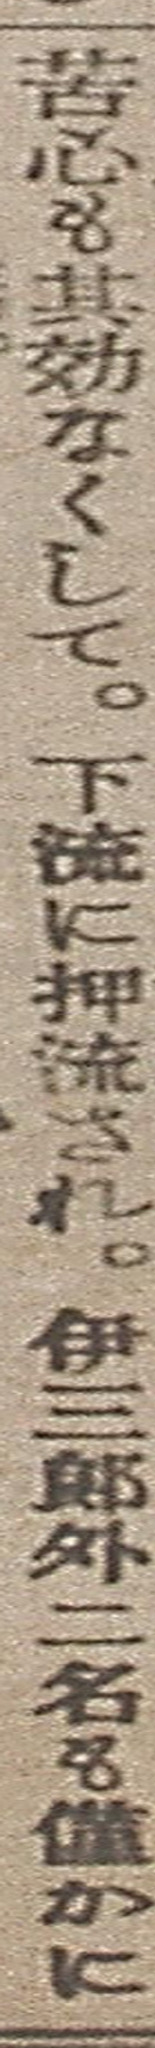苦心も其効なくして。下流に押流され。伊三郎外二名も僅かに
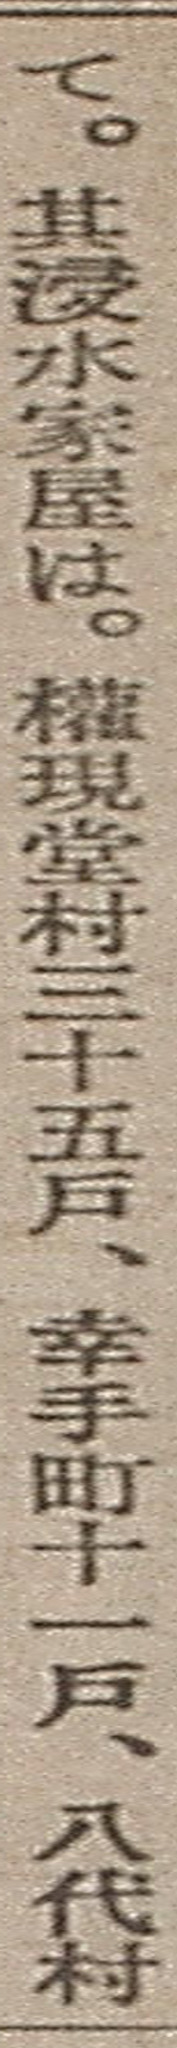て。其浸水家屋は。権現堂村三十五戸、幸手町十一戸、八代村
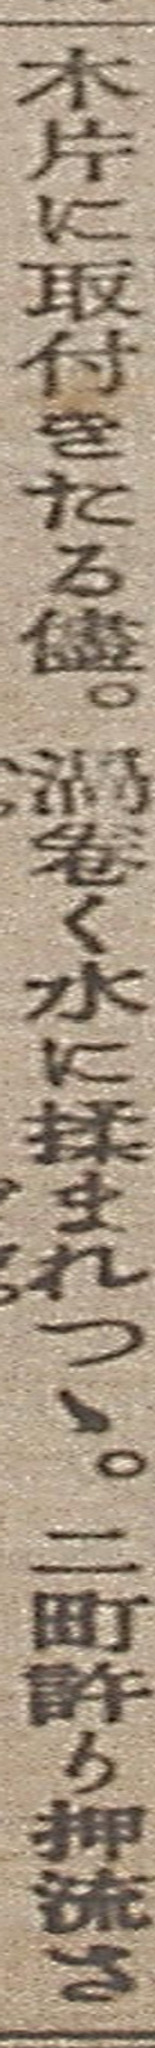木片に取付きたる侭。渦巻く水に揉まれつゝ。二町許り押流さ
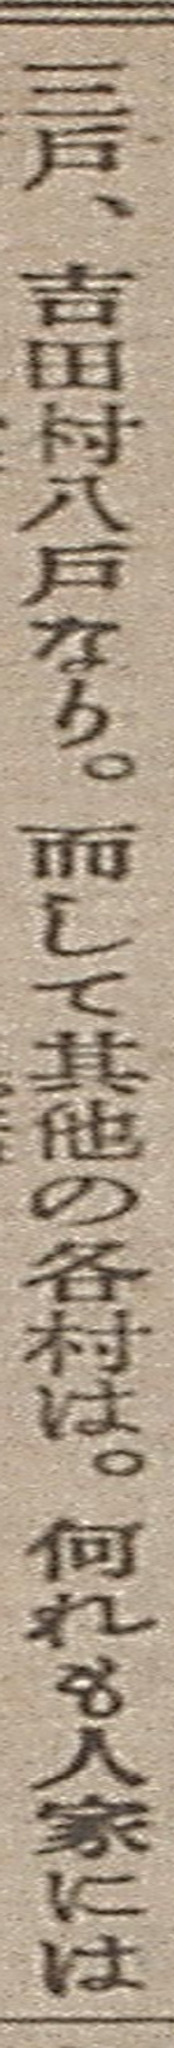三戸、吉田村八戸なり。而して其他の各村は。何れも人家には
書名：風俗畫報臨時増刊第百九十九號　明治三十二年十月各地災害圖會（前編之續）
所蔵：東京大学地震研究所図書室 Earthquake Research Institute Library, The University of Tokyo, JAPAN
